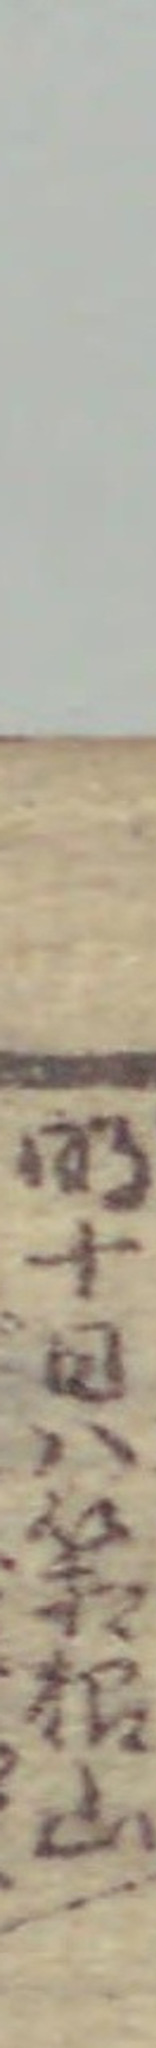明十日は箱根山
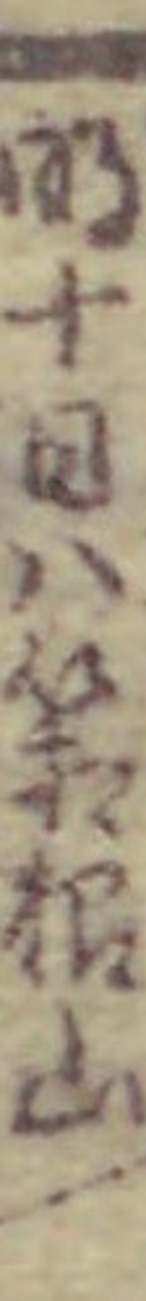明十日は箱根山
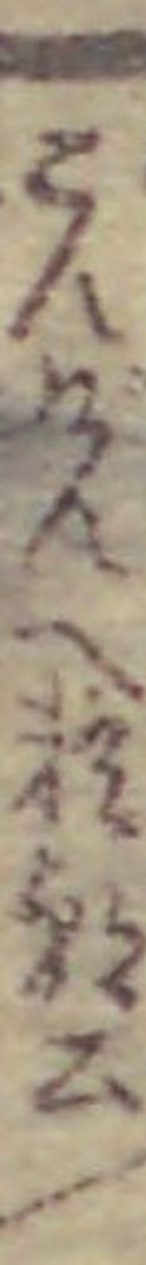こんげんへ頼朝公
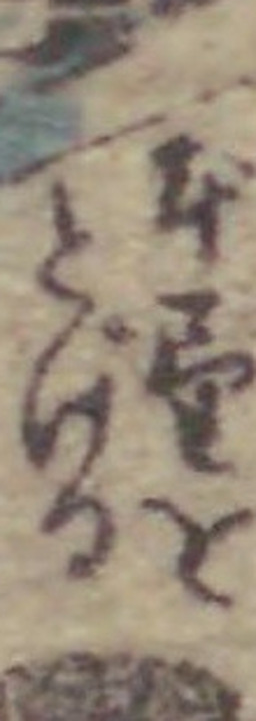とげる
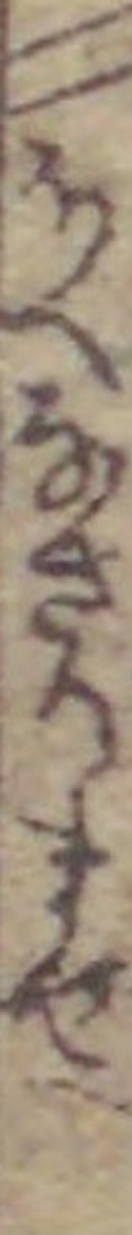ほへなさりませ

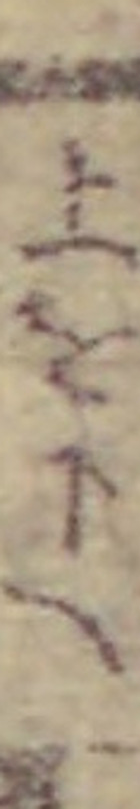上を下へ
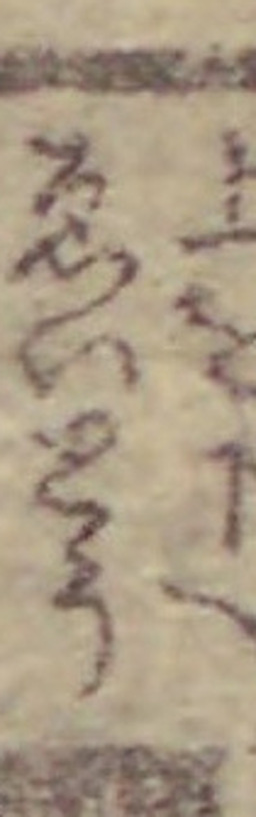ゑいとう
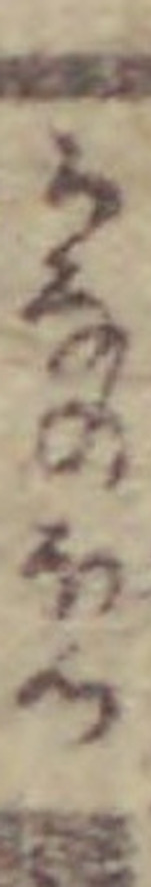かなのほつ
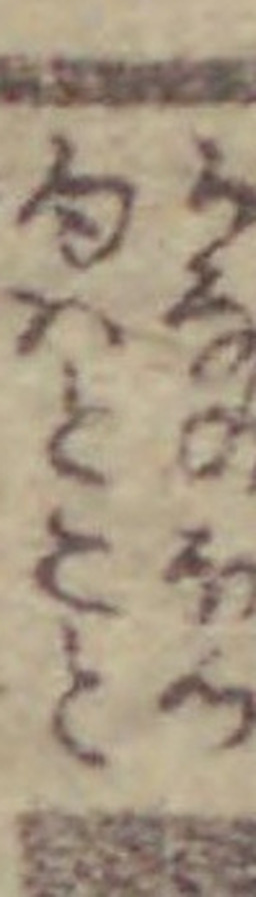句はとこと
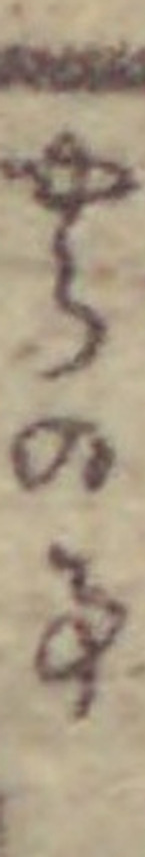やらの事
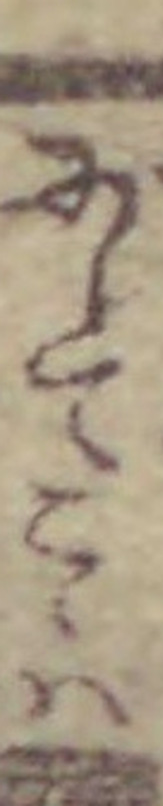にしてこゝは
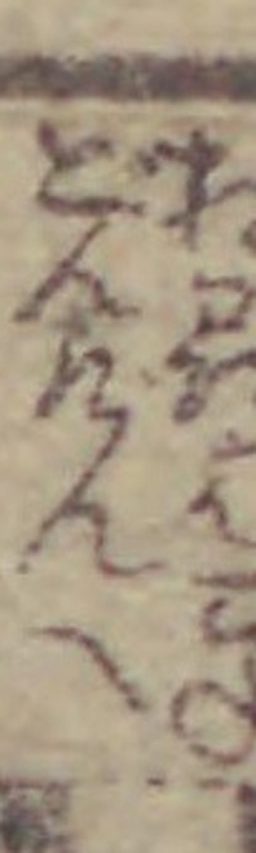ごんげんへ
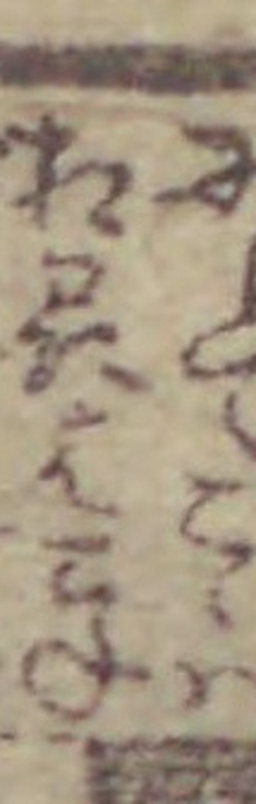相州はこね
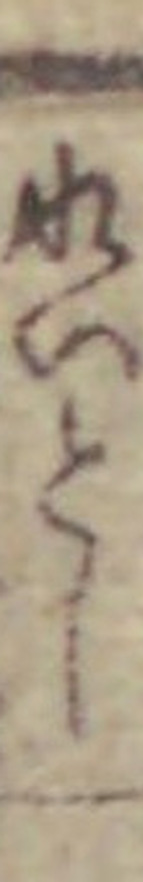れいとし
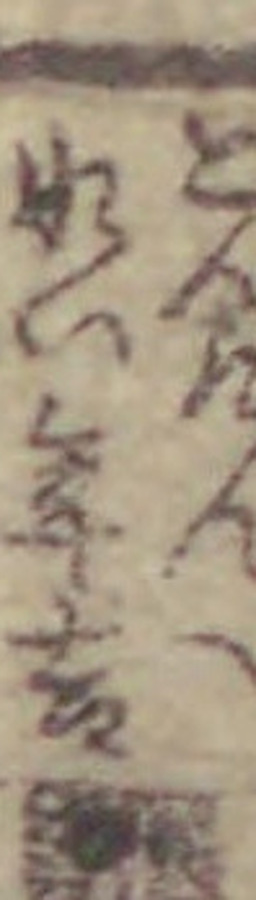れい年吉
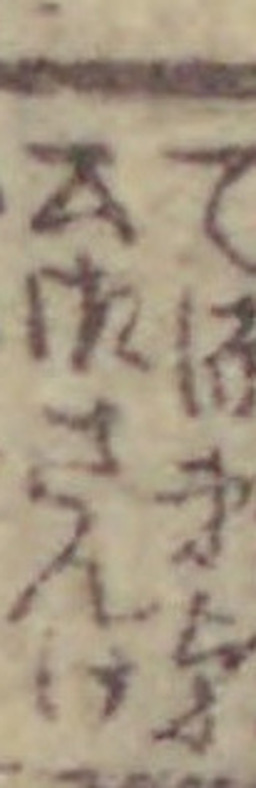公御さんけ
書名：間似合嘘言曽我 3巻
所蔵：国立国会図書館 National Diet Library, JAPAN
